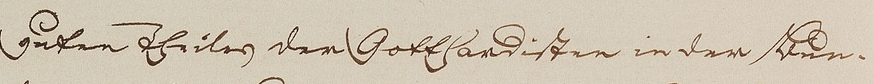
guten Theiles der Gotthardisten in der Bun-
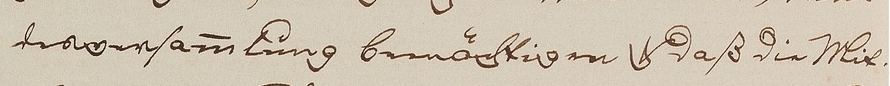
desversammlung bemächtigen & daß die Mit-
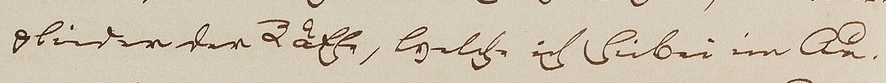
glieder der Räthe, welche ich hiebei im Au-
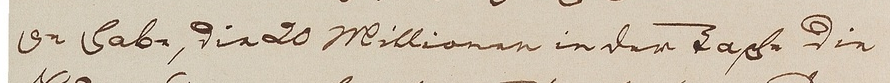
ge habe, die 20 Millionen in der Tasche die
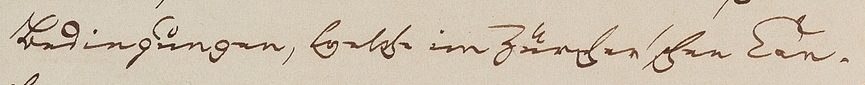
Bedingungen, welche im Zürcher'schen Can-
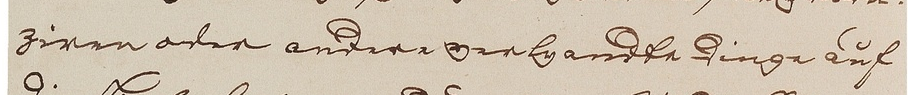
ziren oder andere verwandte Dinge auf
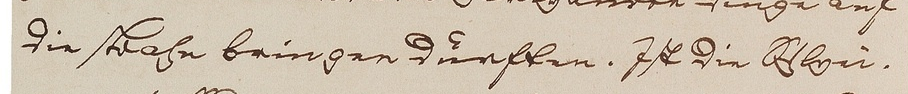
die Bahn bringen dürften. Ist die Schwei-
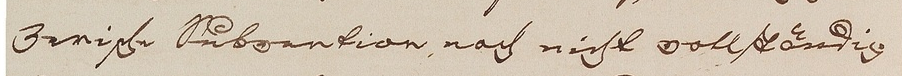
zerische Subvention noch nicht vollständig
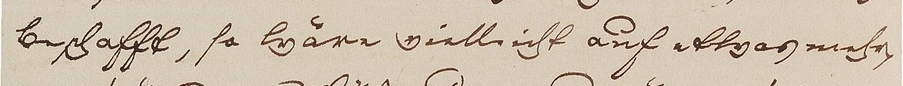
beschafft, so wäre vielleicht auf etwas mehr
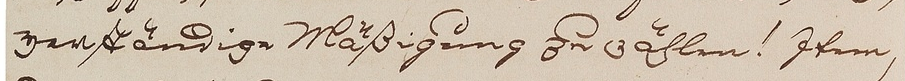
verständige Mäßigung zu zählen! Item,
